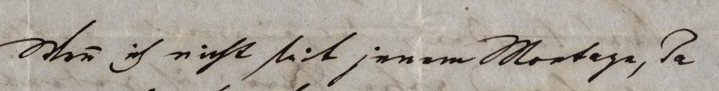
Wenn ich nicht seit jenem Montage, da
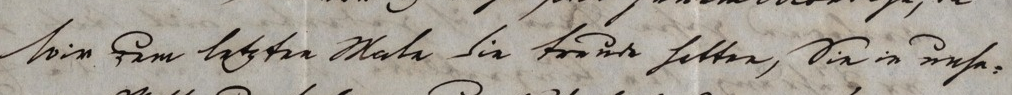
wir zum letzten Male die Freude hatten, Sie in unse-
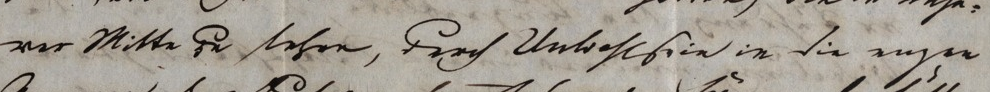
rer Mitte zu sehen, durch Unwohlsein in die engen
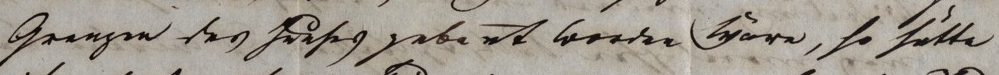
Grenzen des Hauses gebannt worden wäre, so hätte
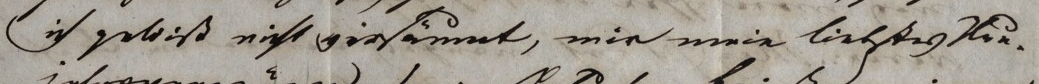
ich gewiß nicht versäumt, mir mein liebstes Neu-
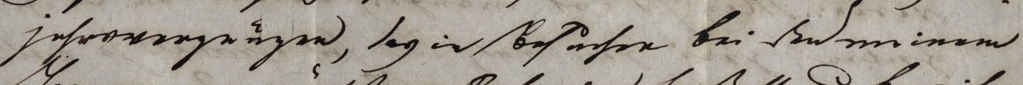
jahrsvergnügen, das in Besuchen bei den meinem
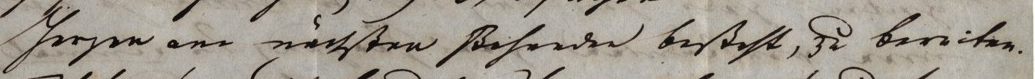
Herzen am nächsten stehenden besteht, zu bereiten.
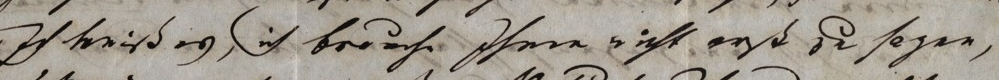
Ich weiß es, ich brauche Ihnen nicht erst zu sagen,
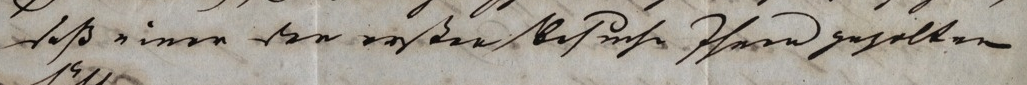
daß einer der ersten Besuche Ihnen gegolten
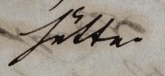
hätte.
